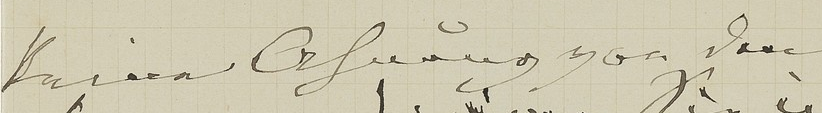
keine Ahnung von den
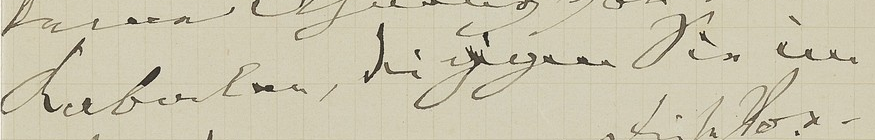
Kabalen, die gegen Sie im
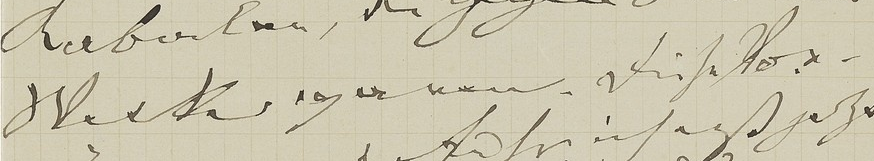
Werke waren. Diese Vor-
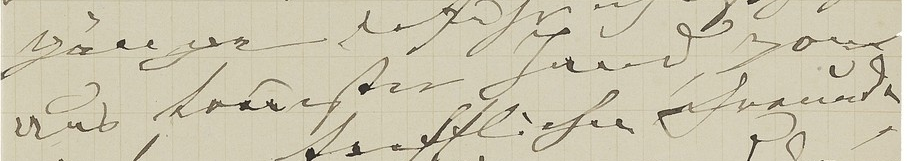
aus treuester Hand von
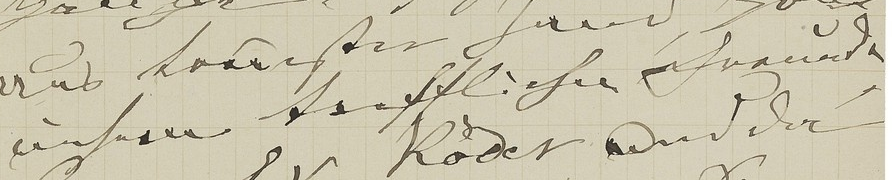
unserm trefflichen Freunde
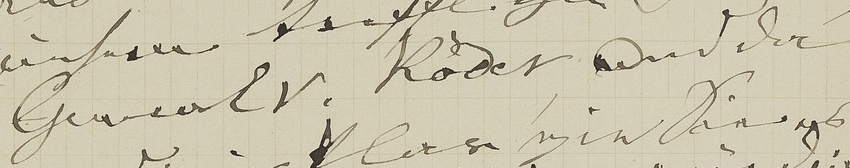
General v. Röder, und da
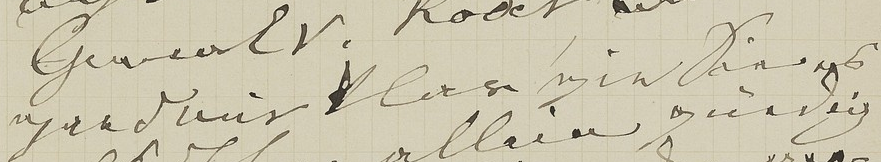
ward mir klar wie Sie es
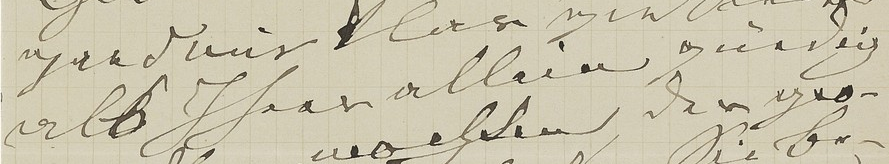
als Ihrer allein würdig
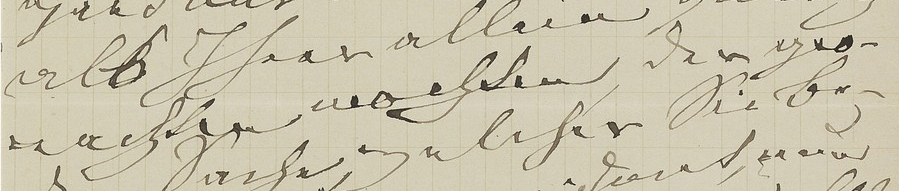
erachten mochten der gro-
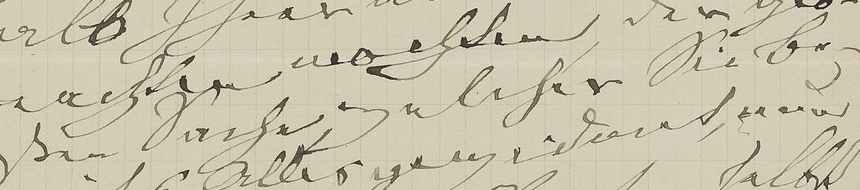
ßen Sache, welcher Sie be-
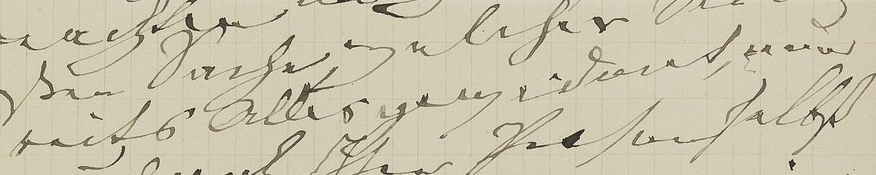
reits Alles gewidmet, nun
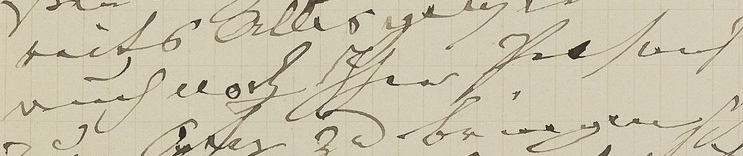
auch noch Ihre Person
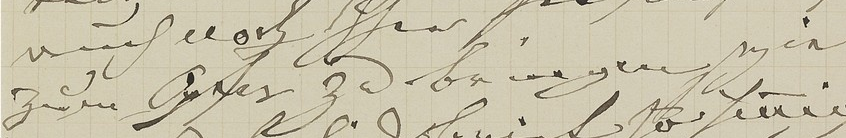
zum Opfer zu bringen, wie
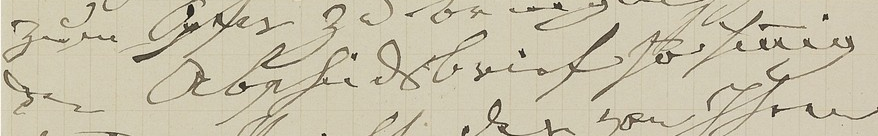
der Abschiedsbrief so sinnig
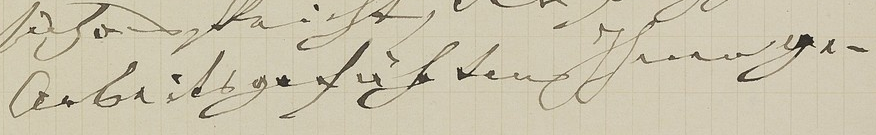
Arbeitsgefährten Ihnen ge-
